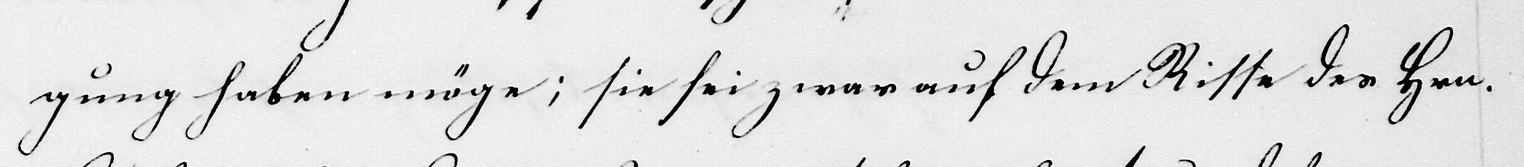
gung haben möge; sie sei zwar auf dem Risse des Hrn.
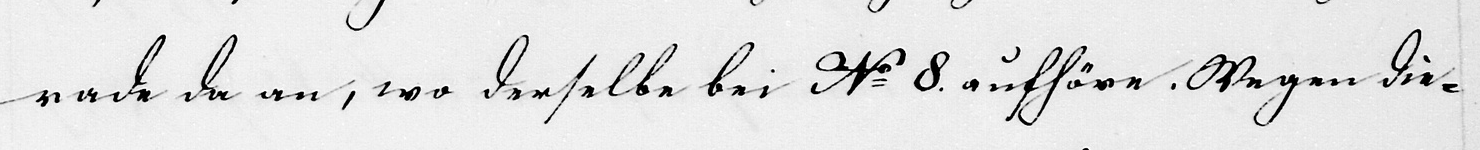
rade da an, wo derselbe bei No 8. aufhöre. Wegen die¬
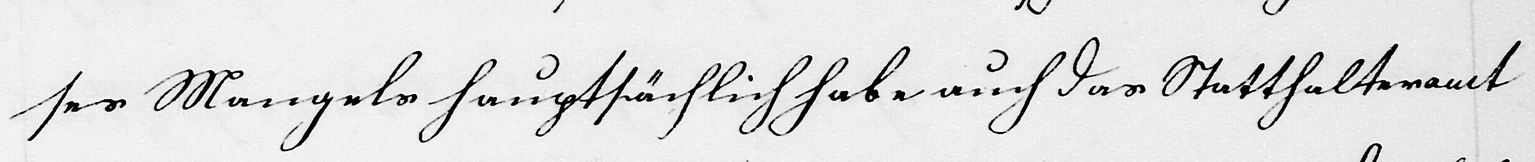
ses Mangels hauptsächlich habe auch das Statthalteramt
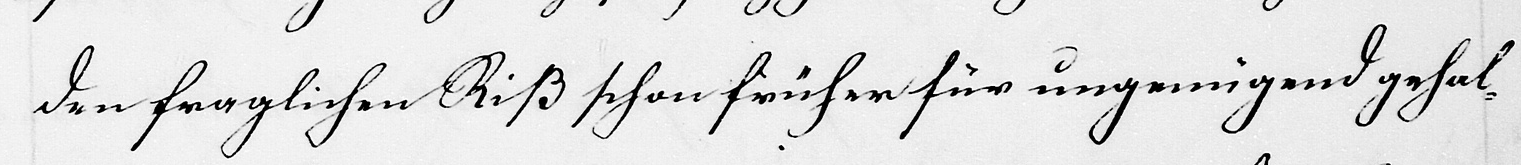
den fraglichen Riß schon früher für ungenügend gehal¬
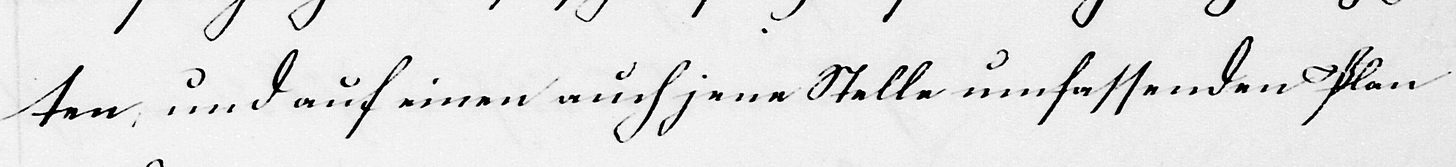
ten, und auf einen auch jene Stelle umfassenden Plan
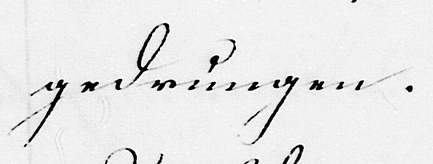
gedrungen.
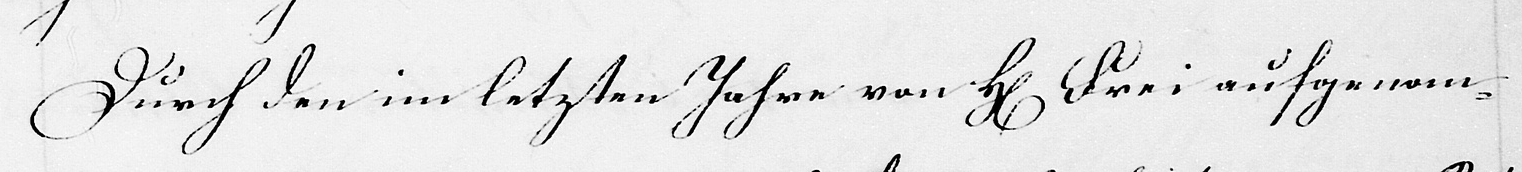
Durch den im letzten Jahre von H[errn] Frei aufgenom¬
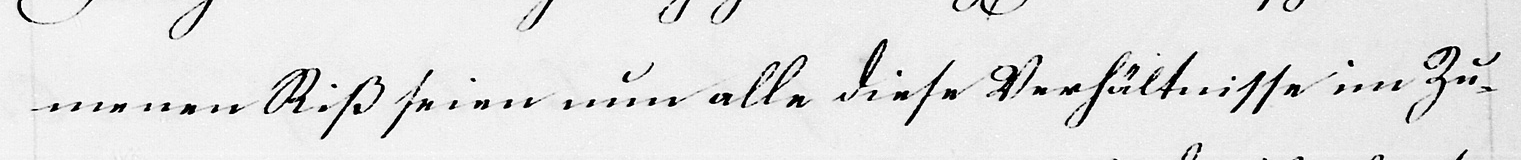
menen Riß seien nun alle diese Verhältnisse im Zu¬
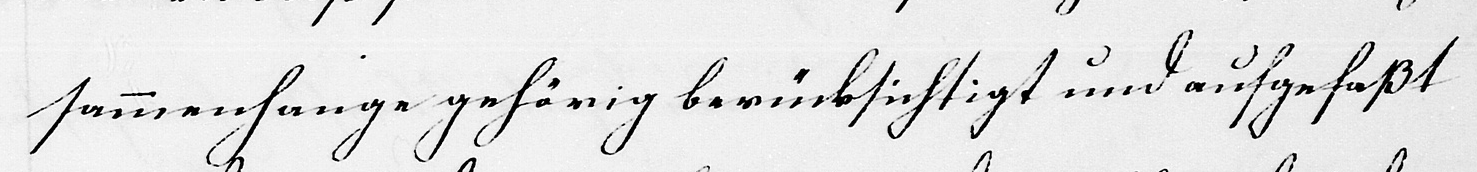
sammenhange gehörig berücksichtigt und aufgefaßt
